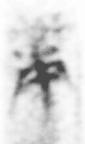莆
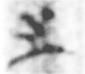之
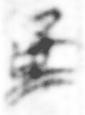爲
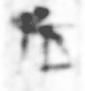○（左）
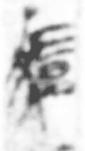驂
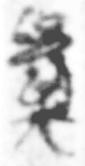慶（卿）
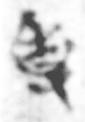事（士）
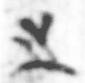之
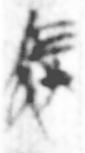駟
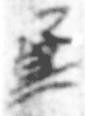爲
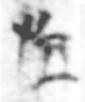○（左）
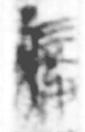○（服）
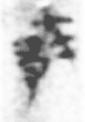蔡
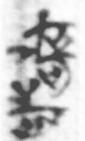齮
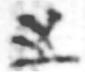之
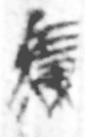騍
